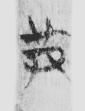{廿四}
